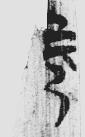而
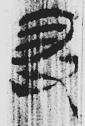○（得）
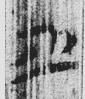之
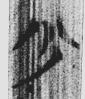少
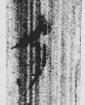人
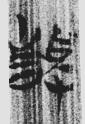靜
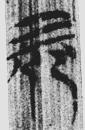而
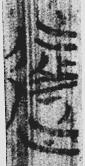遠
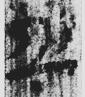之
